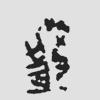𨌤
